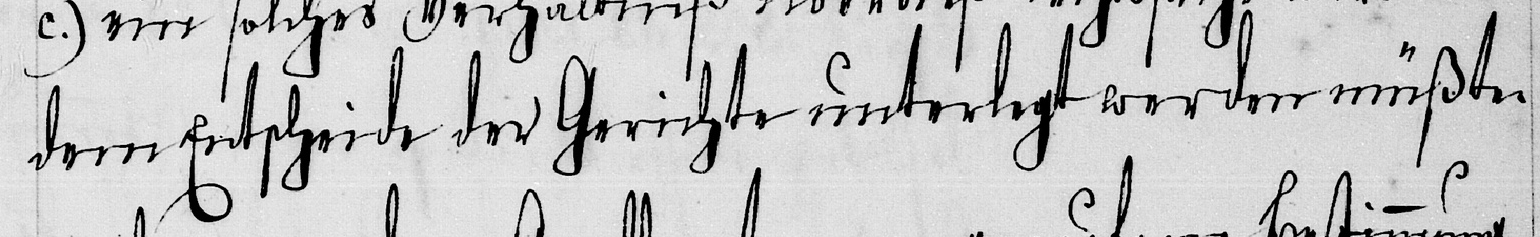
dem Entscheide der Gerichte unterlegt werden müßte.
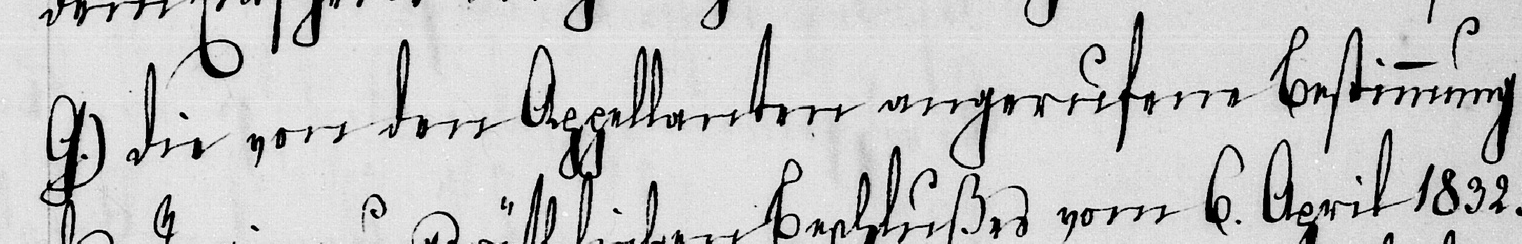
G.) die von den Appellanten angerufene Bestimmung
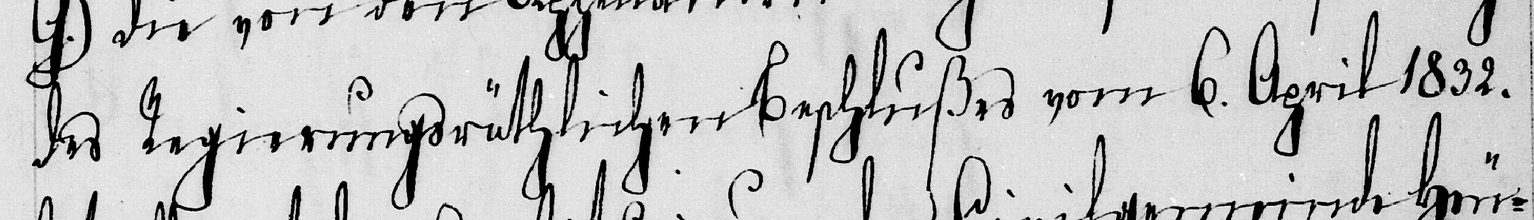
des Regierungsräthlichen Beschlußes vom 6. April 1832.
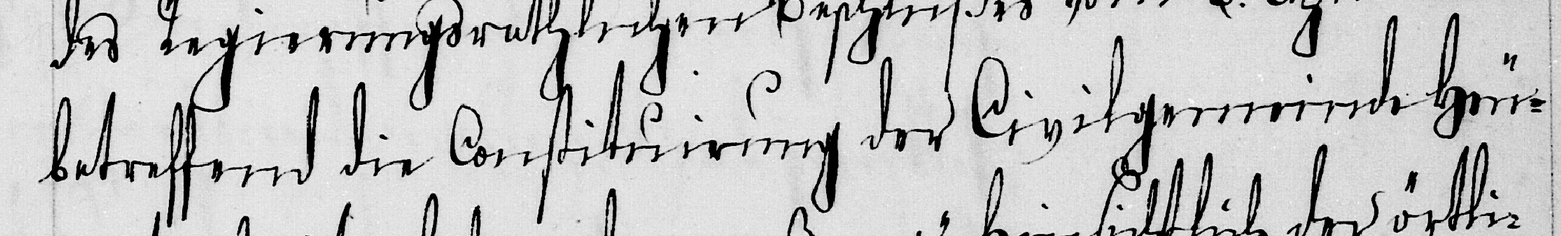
betreffend die Constituirung der Civilgemeinde Heu¬
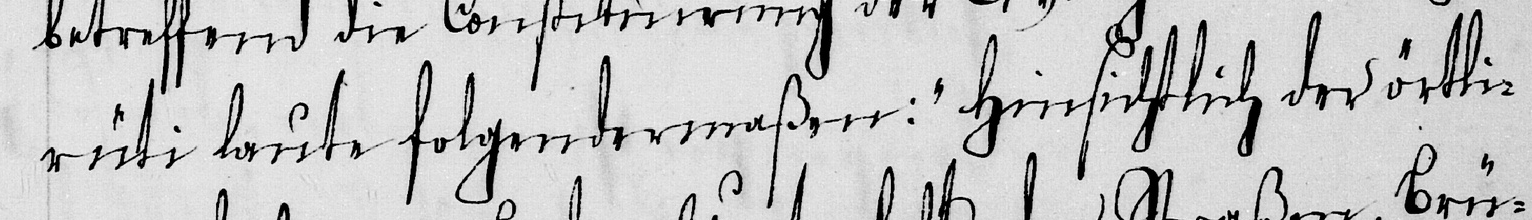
rüti laute folgendermaßen: „Hinsichtlich der örtli¬
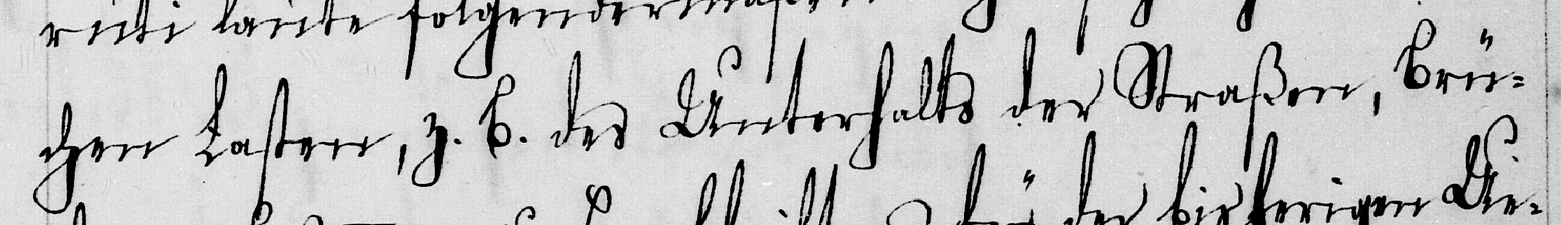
chen Lasten, z. B. des Unterhalts der Straßen, Brü¬
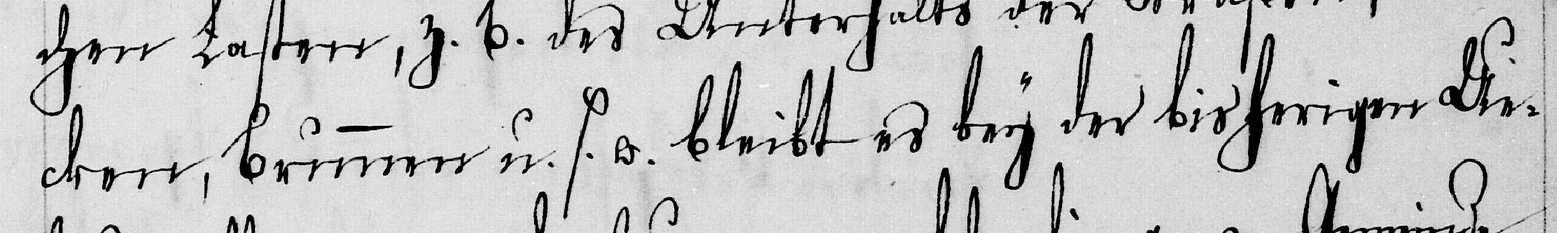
cken, Brunnen u. s. w. bleibt es bey der bisherigen Ue¬
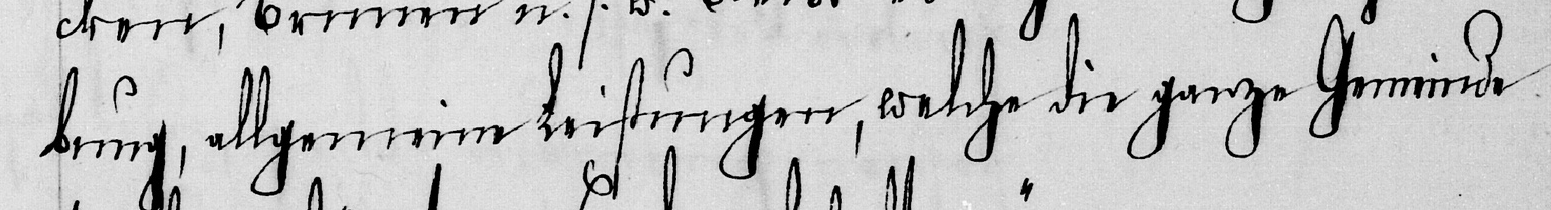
bung, allgemeine Leistungen, welche die ganze Gemeinde
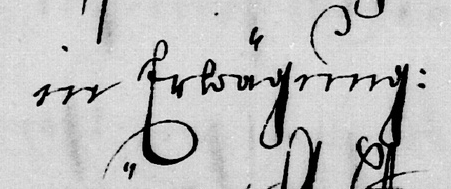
in Erwägung:
